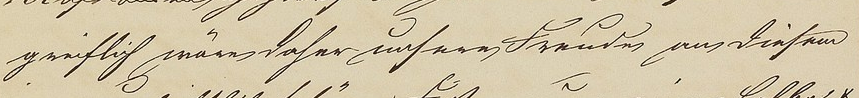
greiflich wäre daher unsere Freude an diesem
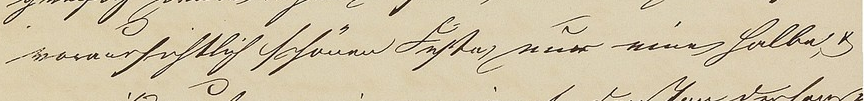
voraussichtlich schönen Feste nur eine halbe, &
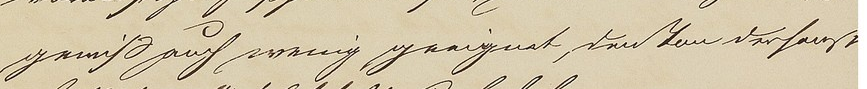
gewiß auch wenig geeignet, den Ton der sonst
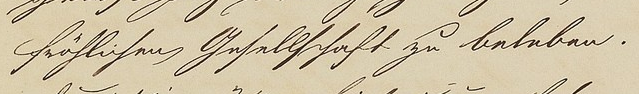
fröhlichen Gesellschaft zu beleben.
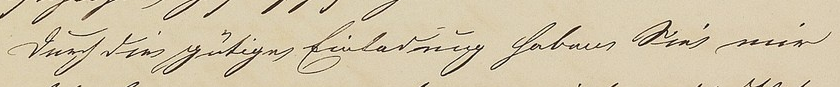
Durch die gütige Einladung haben Sie mir
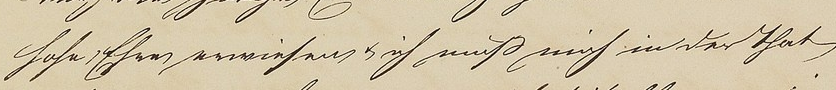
hohe Ehre erwiesen & ich muß mich in der That
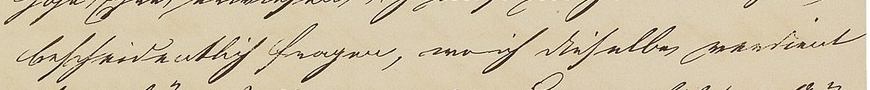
bescheidentlich fragen, wo ich dieselbe verdient
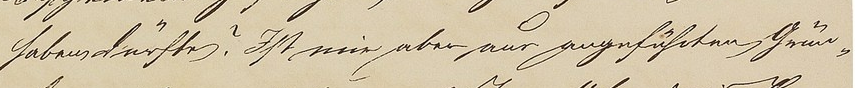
haben dürfte? Ist mir aber aus angeführten Grün-
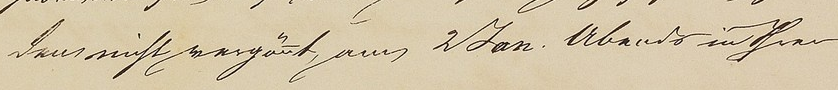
den nicht vergönnt, am 2 Jan. Abends in Ihrer
